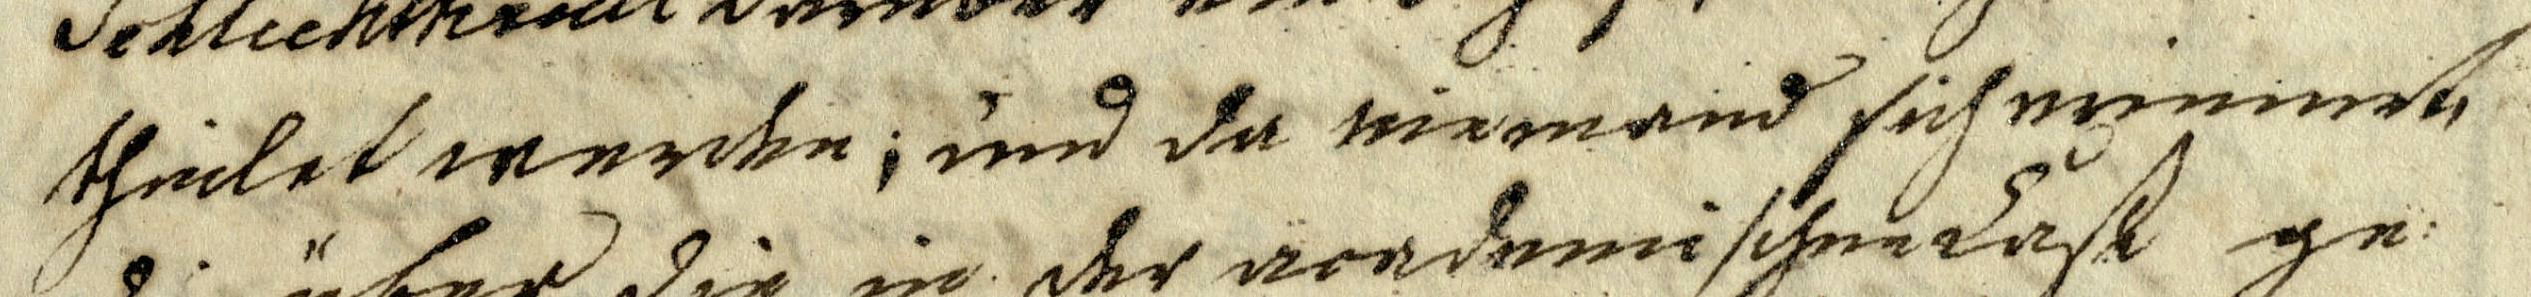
theilet werden, und da niemand sich erinnert,
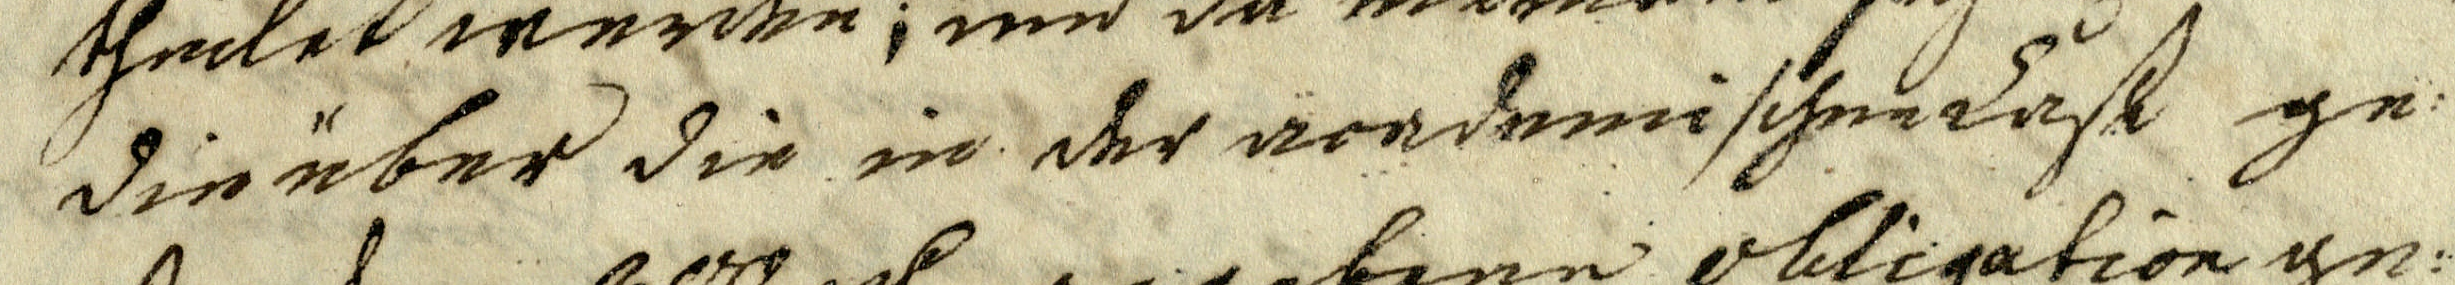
die über die in der academischen Caße ge¬
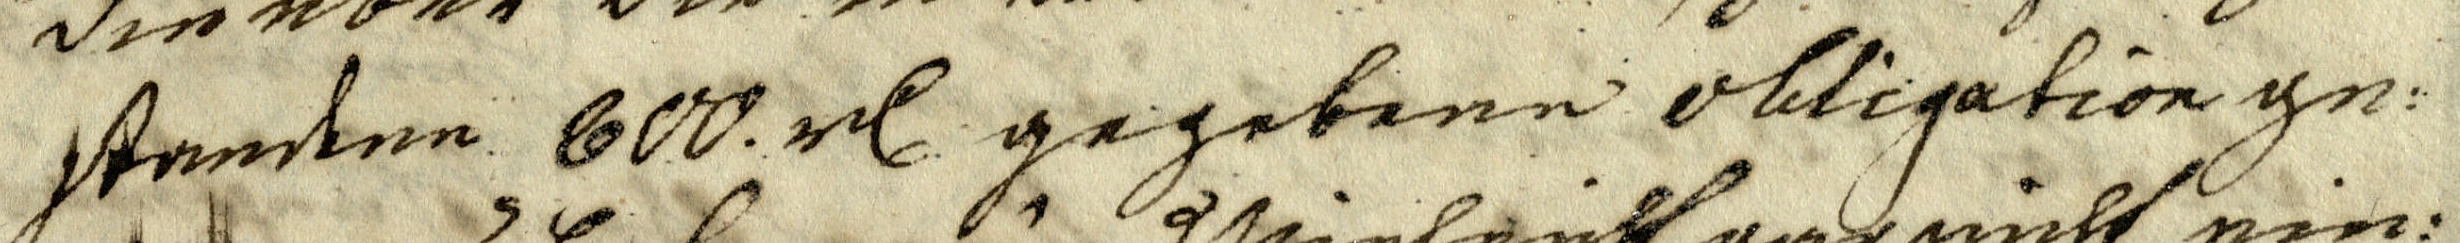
standenen 800. r. gegebene obligation ge¬
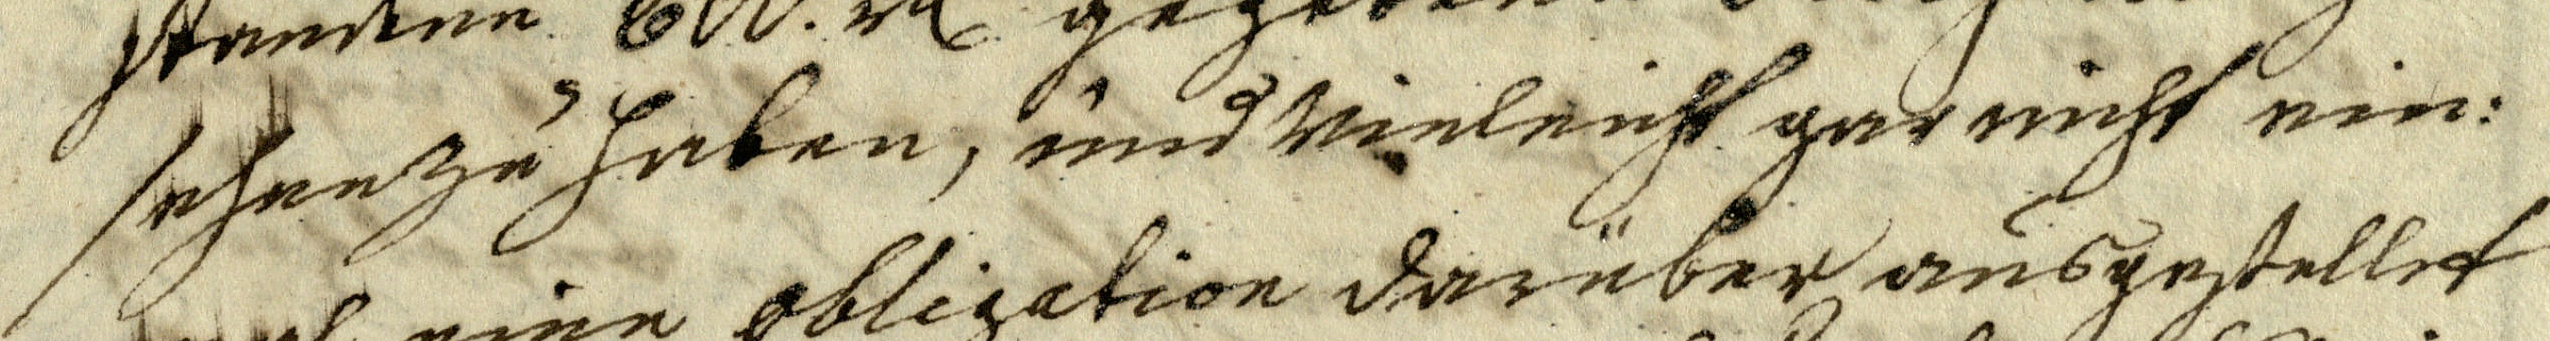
sehen zu haben, und vieleicht gar nicht ein¬
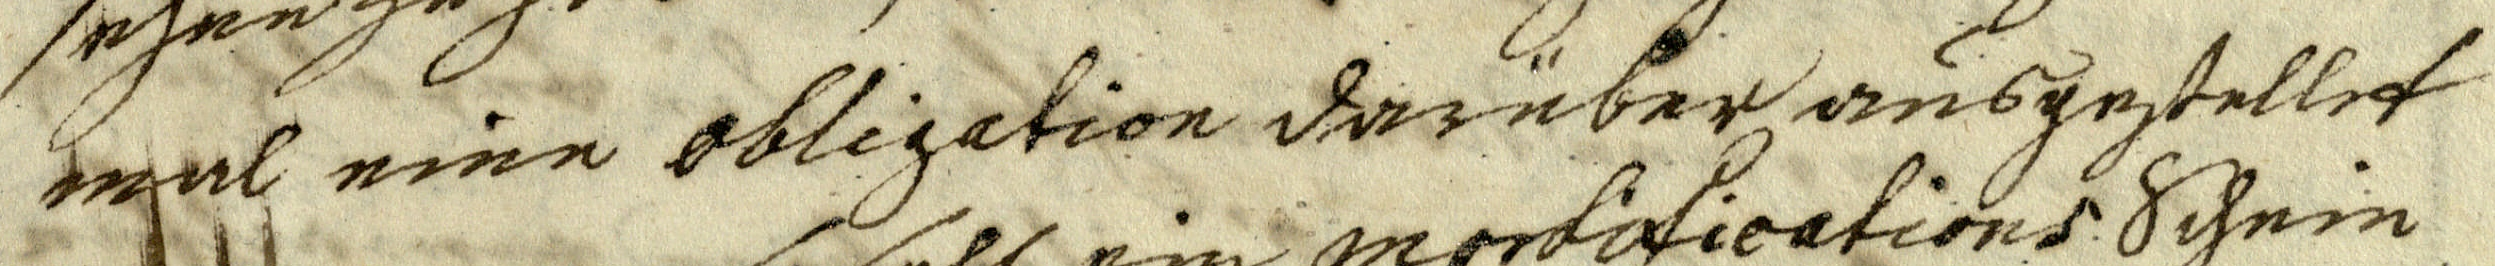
mal eine obligation darüber ausgestellet
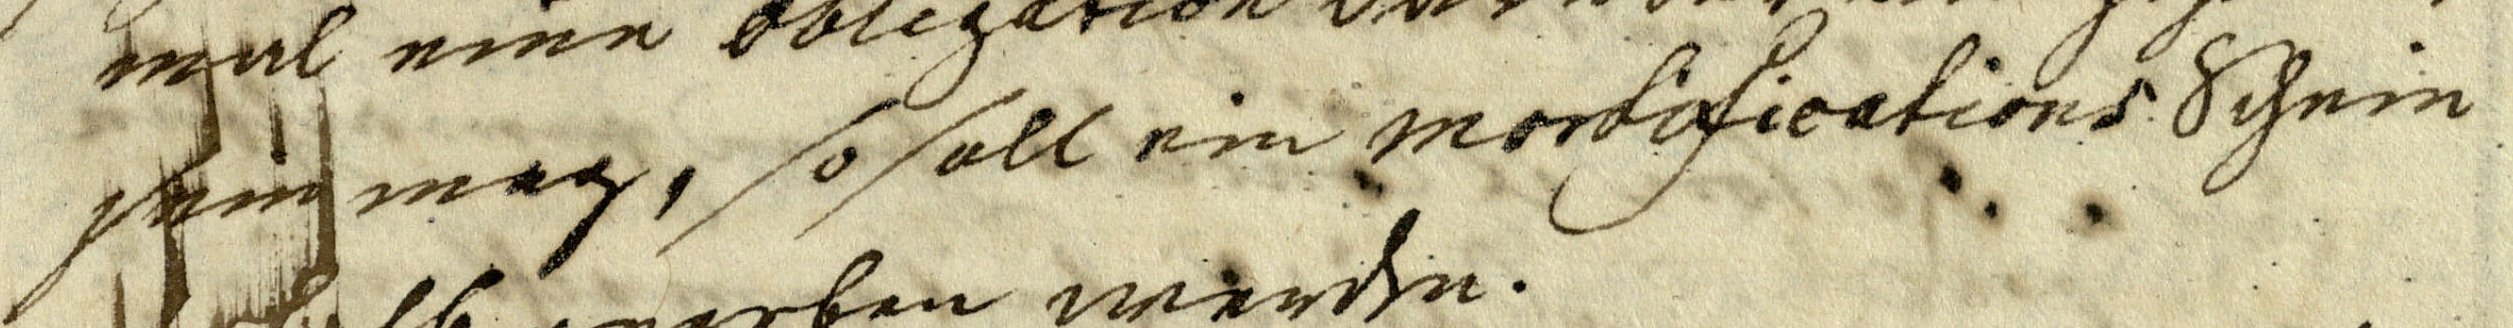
sein mag, so soll ein mortifications Schein
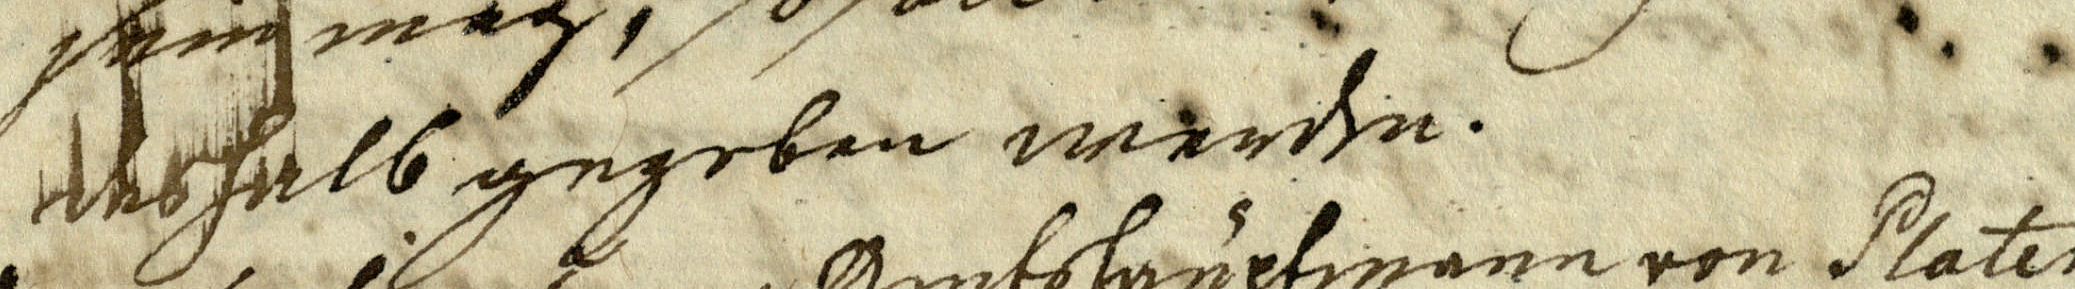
deshalb gegeben werden.
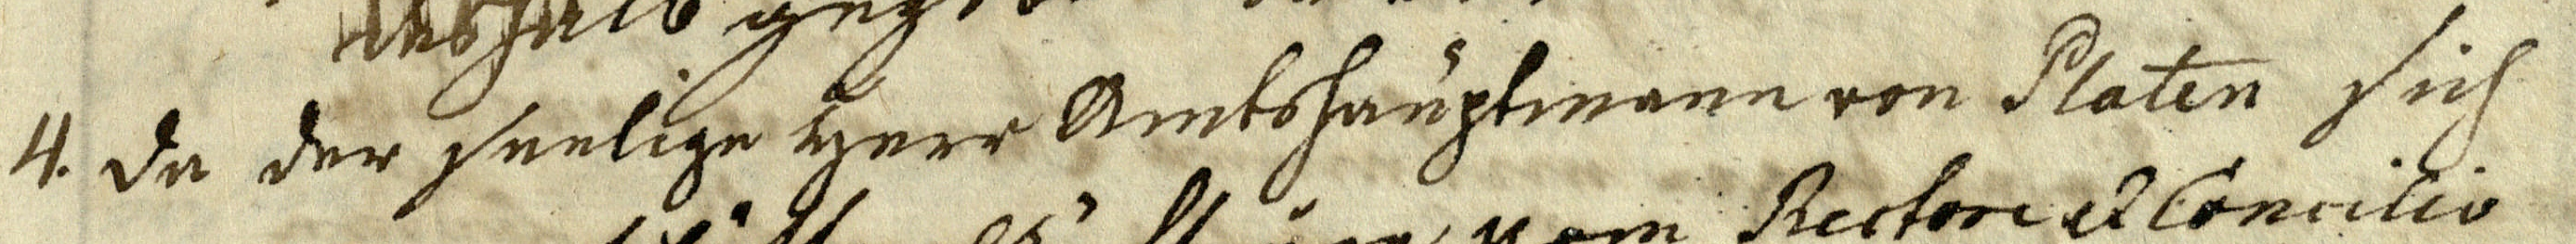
4. Da der seelige Herr Amtshauptmann von Platen sich
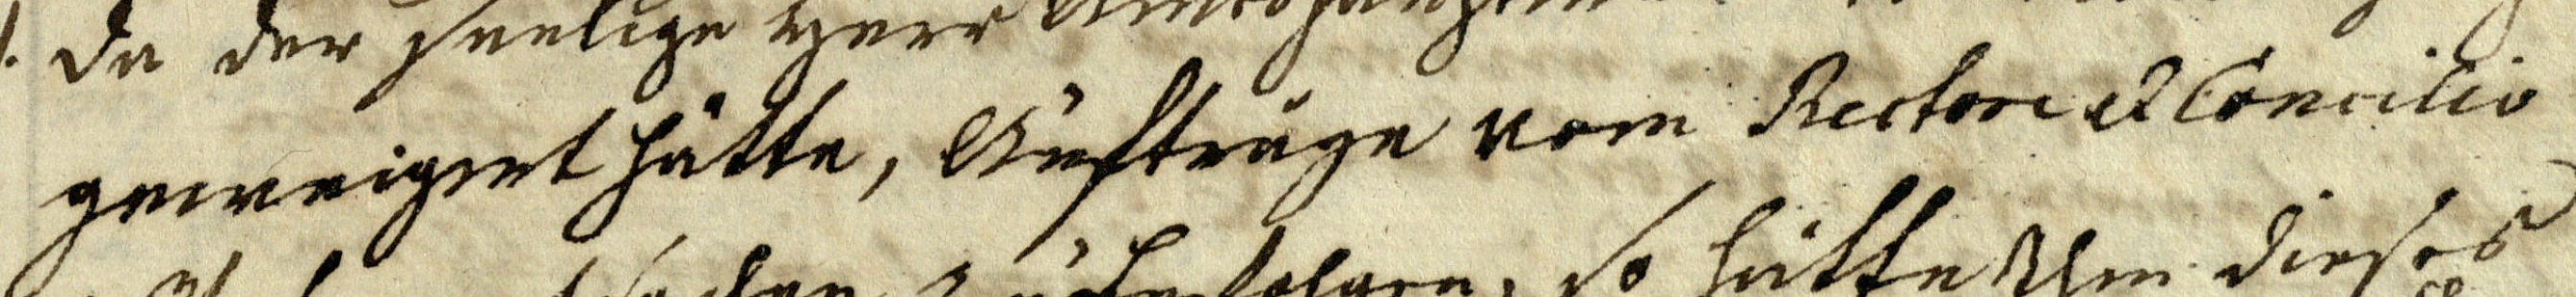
geweigert hätte, Aufträge vom Rectori et Concilio
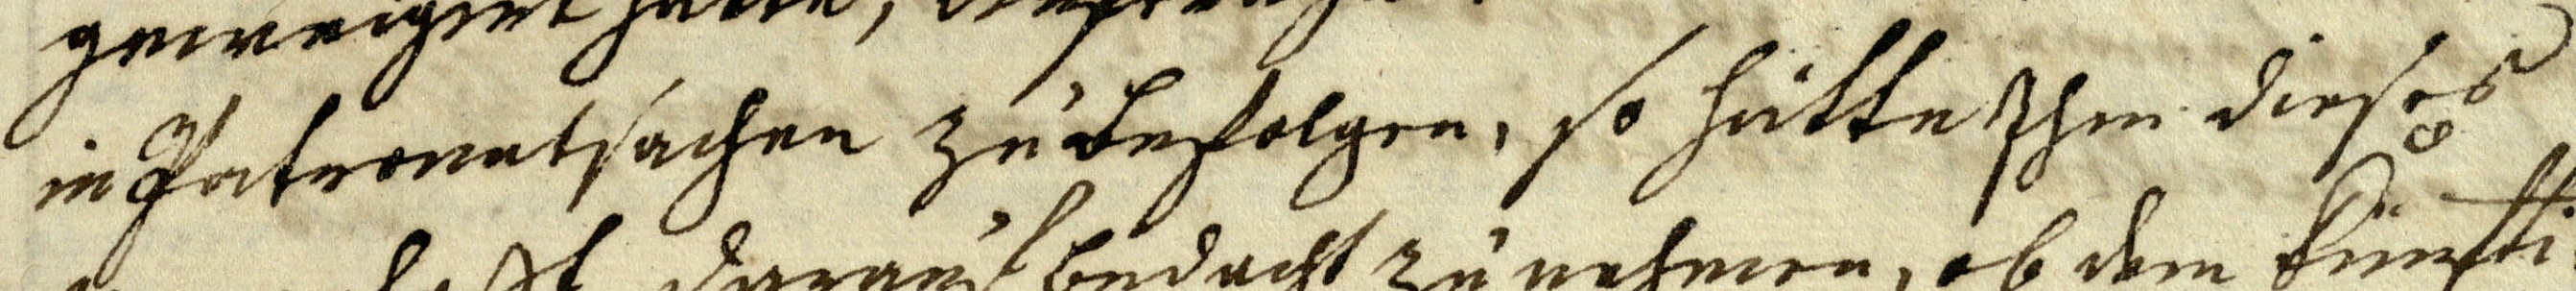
in Patronatsachen zu befolgen, so hätte Ihm dieses
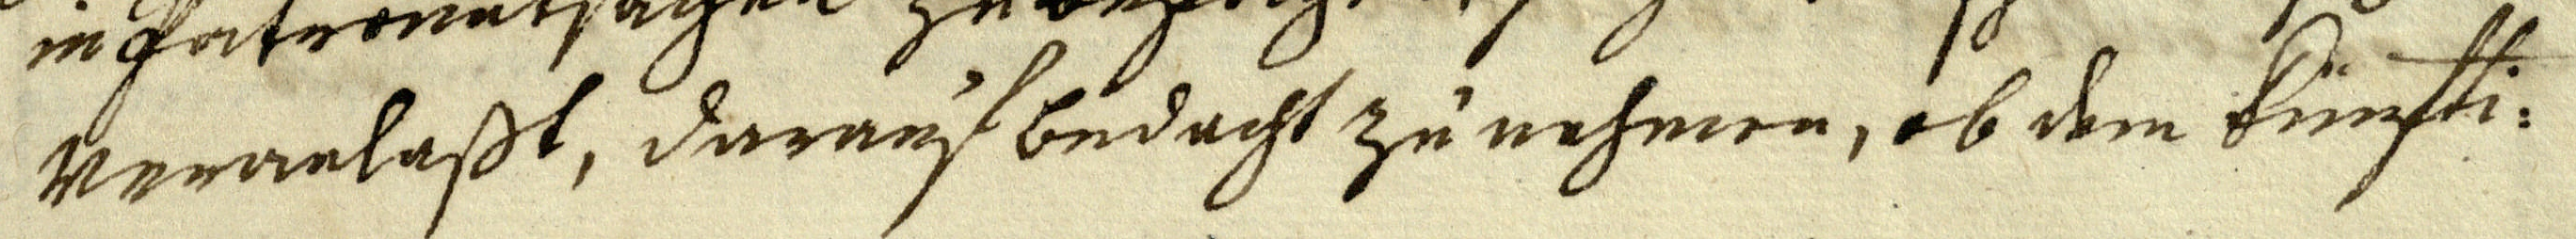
veranlaßt, darauf Bedacht zu nehmen, ob dem künfti¬
